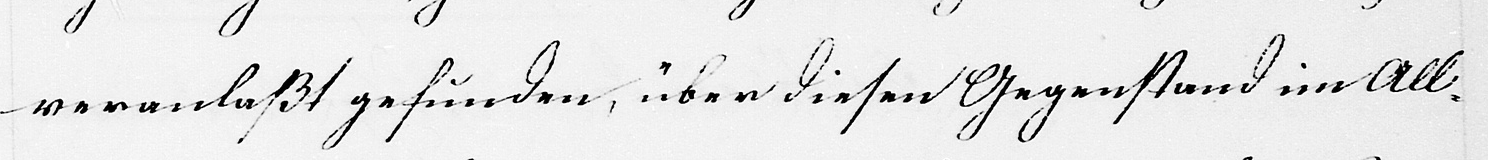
veranlaßt gefunden, über diesen Gegenstand im All¬
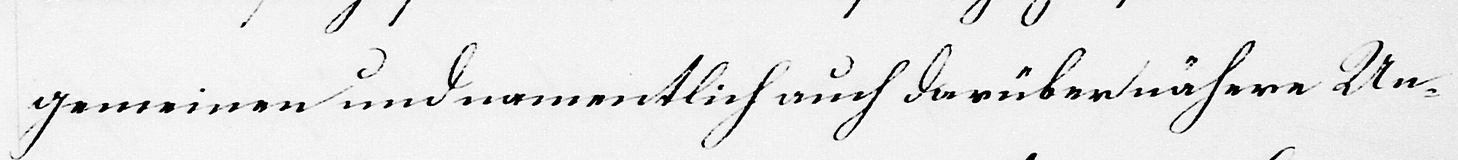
gemeinen und namentlich auch darüber nähere Un¬
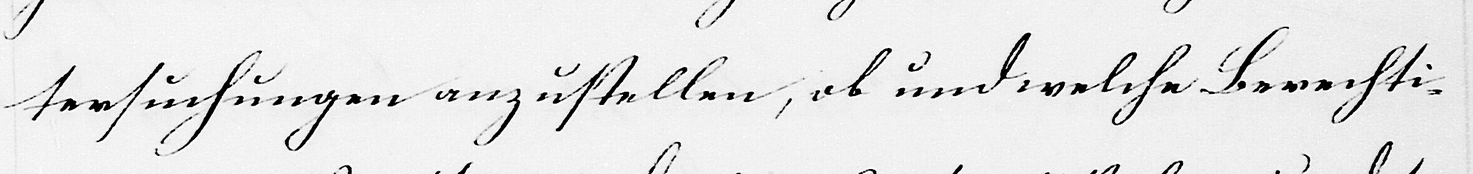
tersuchungen anzustellen, ob und welche Berechti¬
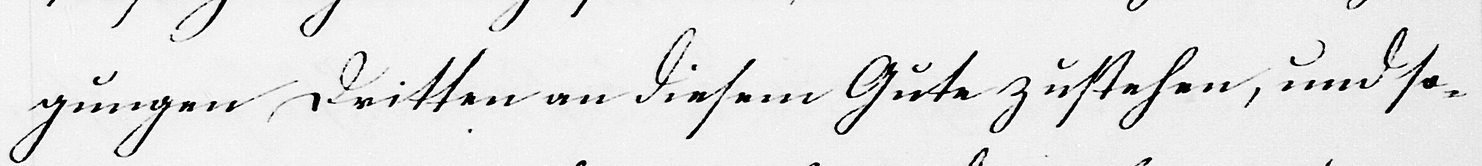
gungen Dritten an diesem Gute zustehen, und so¬
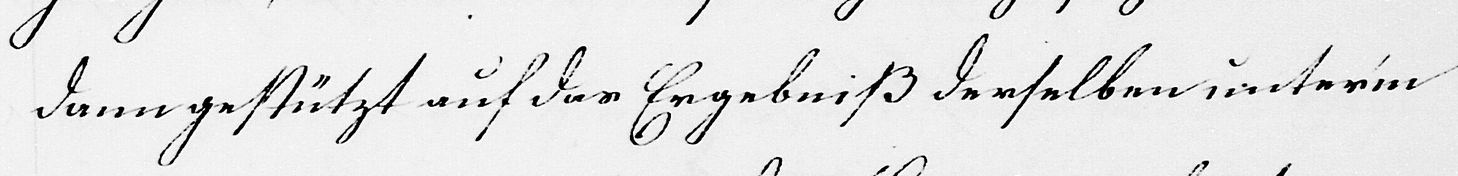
dann gestützt auf das Ergebniß derselben unterm
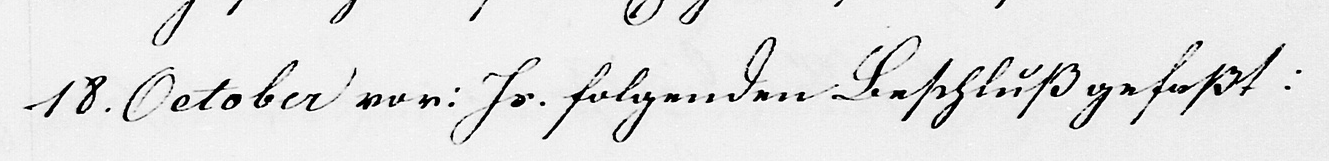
18. October vor: Js. folgenden Beschluß gefaßt:
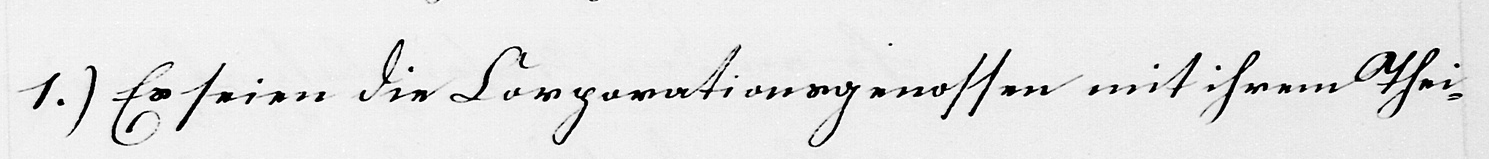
1.) Es seien die Corporationsgenossen mit ihrem Thei¬
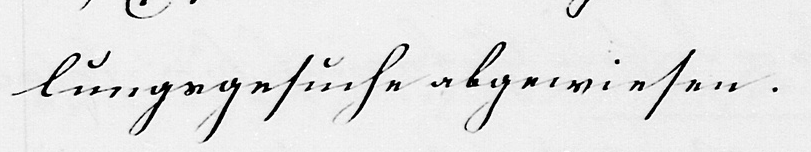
lungsgesuche abgewiesen.
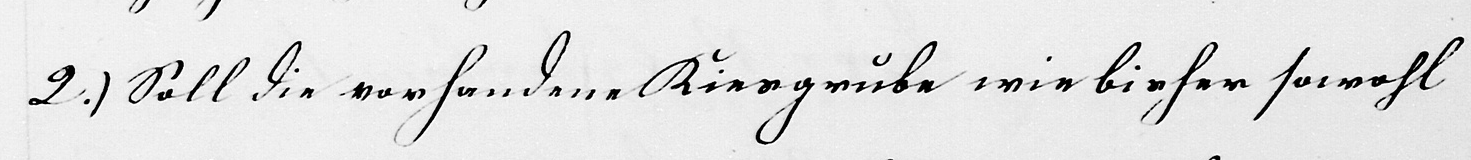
2.) Soll die vorhandene Kiesgrube wie bisher sowohl
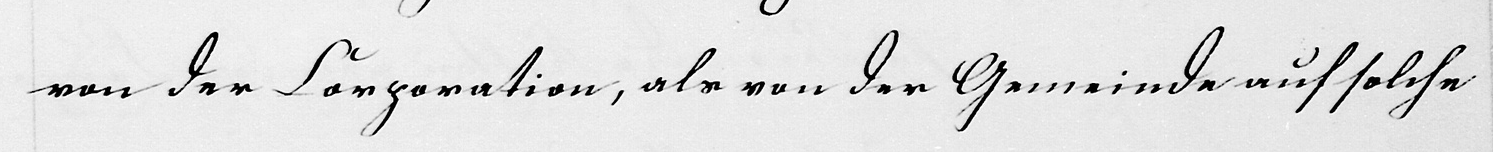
von der Corporation, als von der Gemeinde auf solche
